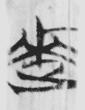麥
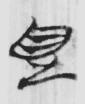見
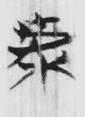枼
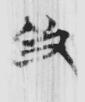及
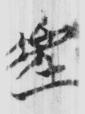𫊟
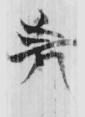先
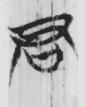君
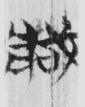戕
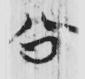公
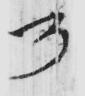乃
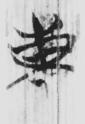東
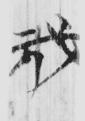伐
